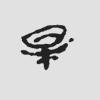杲
